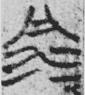汬
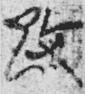攺
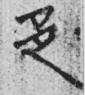邑
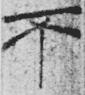不
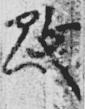攺
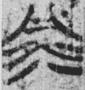汬
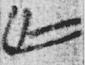亡（无）
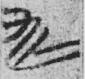○（喪）
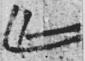亡（无）
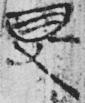○（得）
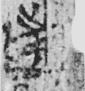○（往）
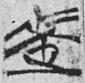○（來）
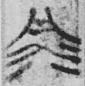汬汬
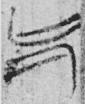气（汔）
